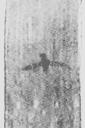七
